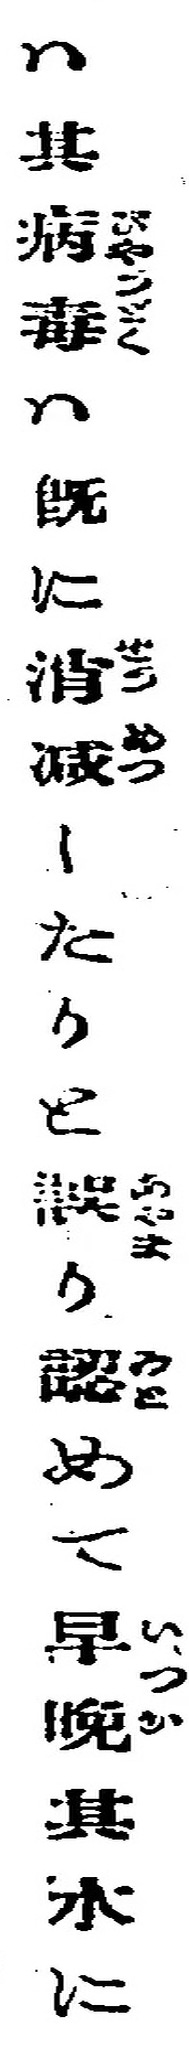は其病毒は既に消滅したりと誤り認めて早晩其水に
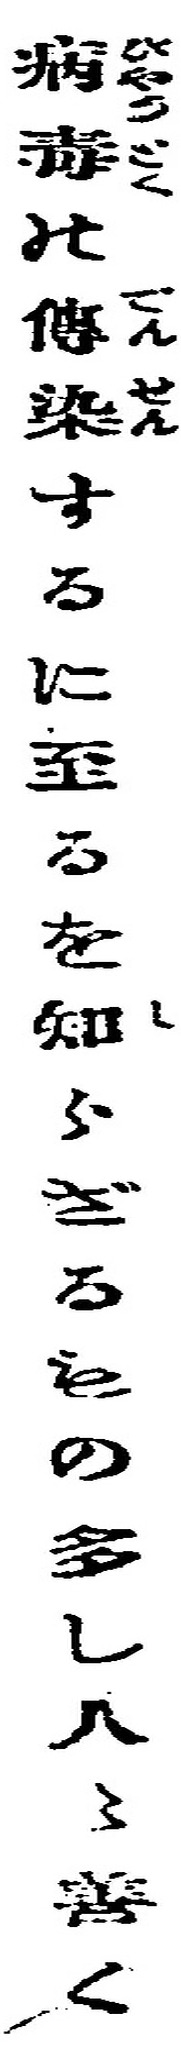病毒の伝染するに至るを知らざるもの多し人々善く
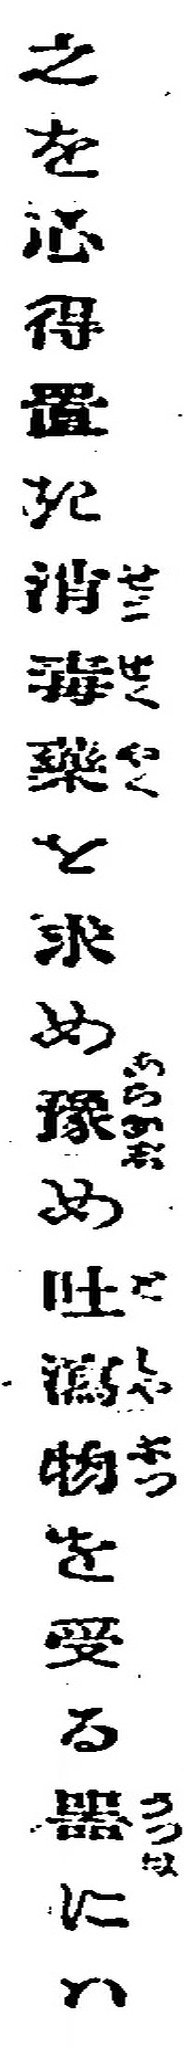之を心得置き消毒薬を求め予め吐瀉物を受る器には
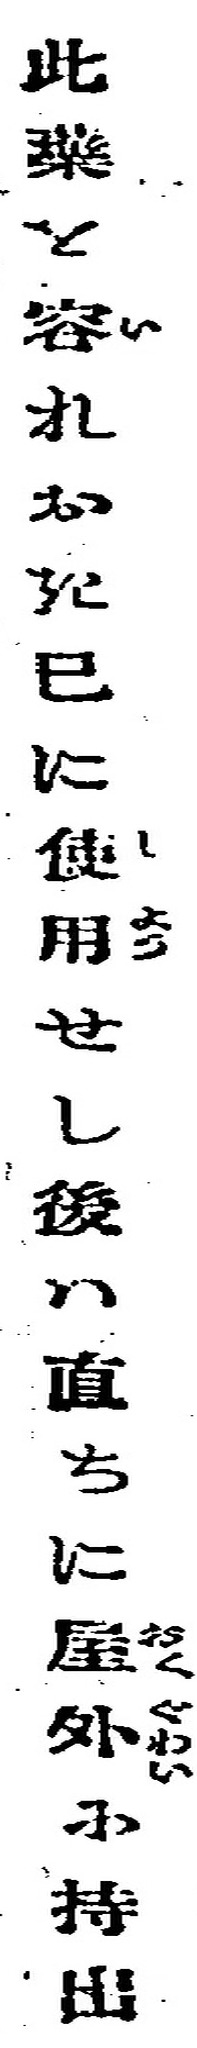此薬を容れおき已に使用せし後は直ちに屋外に持出
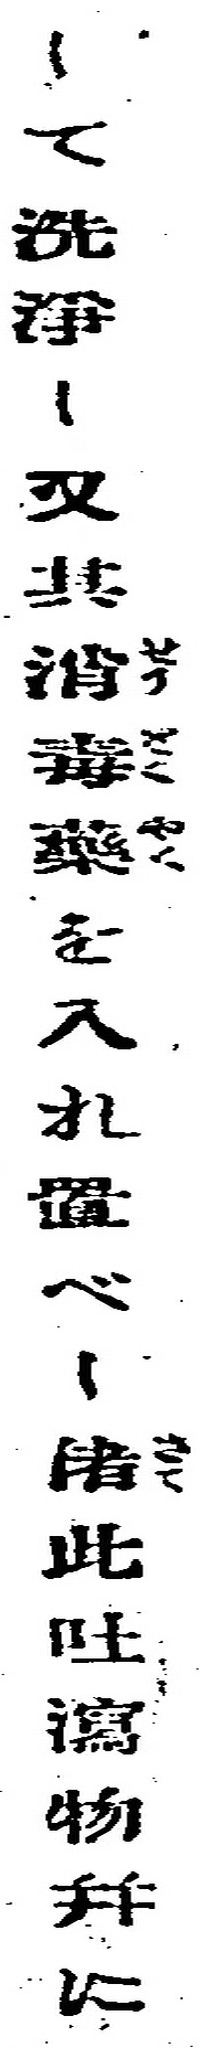して洗浄し又其消毒薬を入れ置べし偖此吐瀉物并に

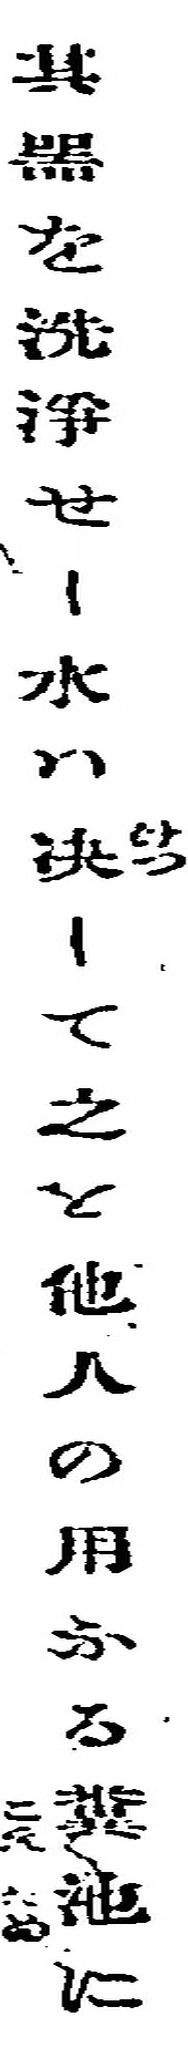其器を洗浄せし水は決して之を他人の用ふる糞池に
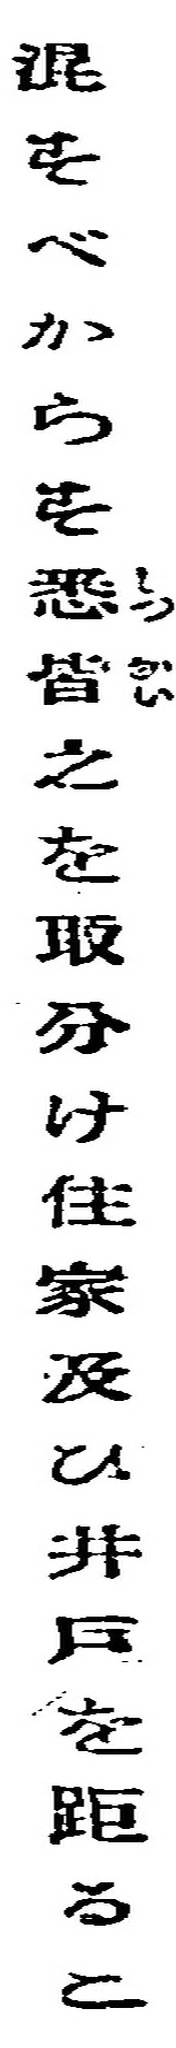混すべからす悉皆之を取分け住家及ひ井戸を距るこ
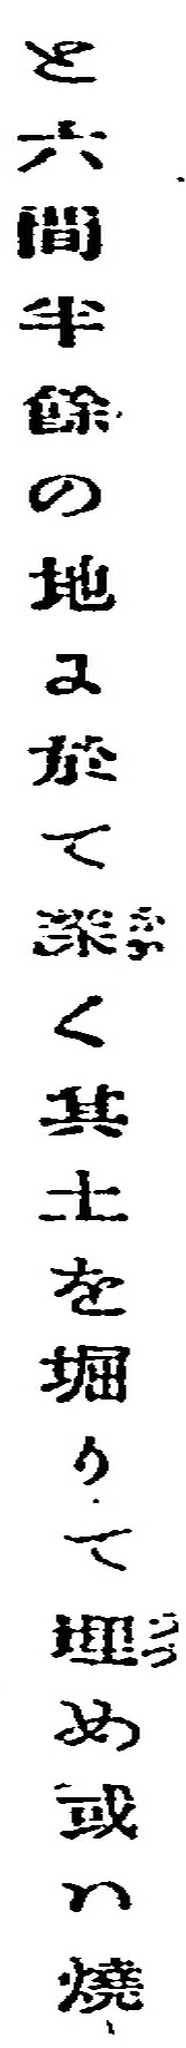と六間半余の地に於て深く其土を堀りて埋め或は焼
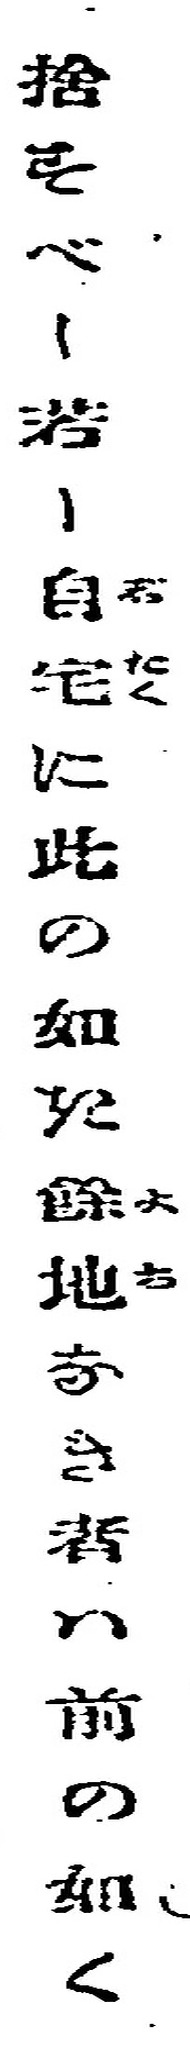捨すべし若し自宅に此の如き余地なき者は前の如く
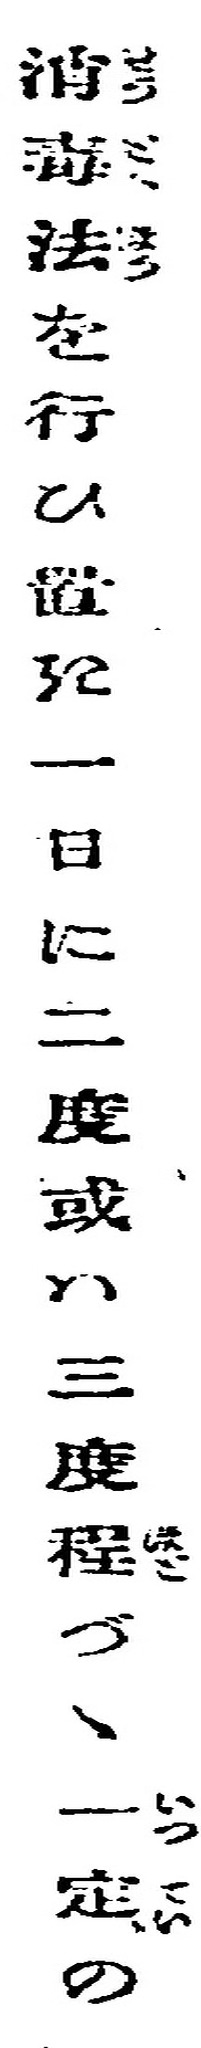消毒法を行ひ置き一日に二度或は三度程づゝ一定の
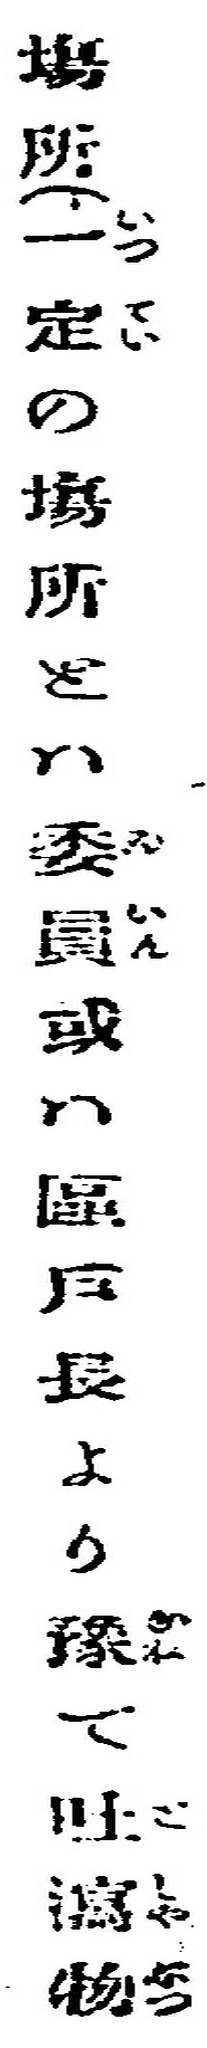場所(一定の場所とは委員或は区戸長より予て吐瀉物
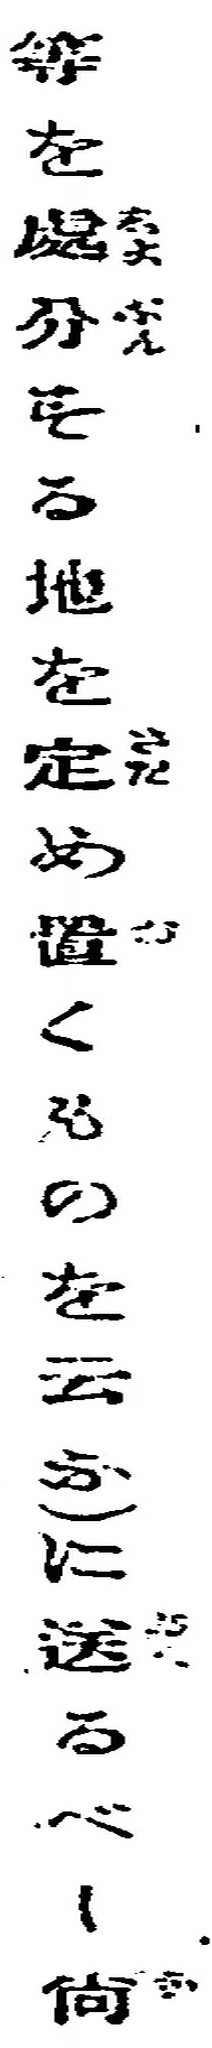等を処分する地を定め置くものを云ふ)に送るべし尚
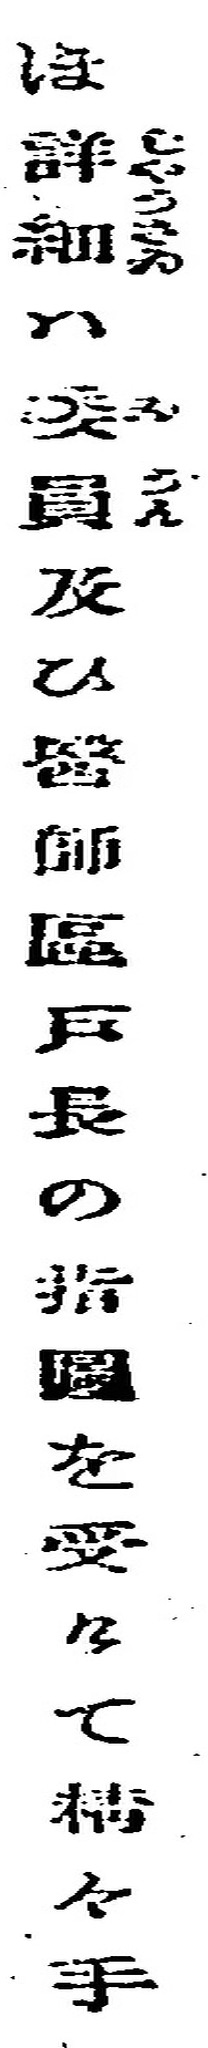ほ詳細は委員及ひ医師区戸長の指図を受けて精々手
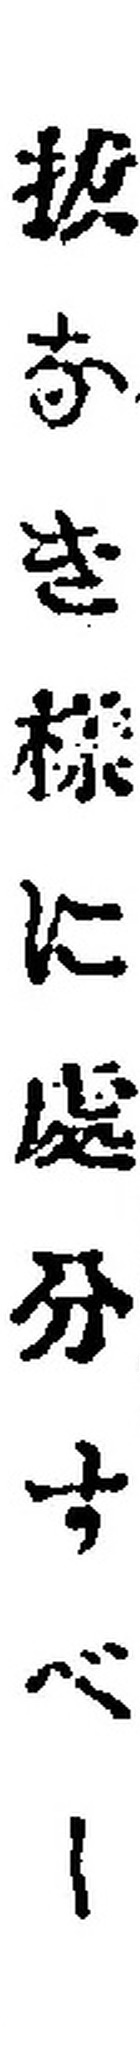抜なき様に処分すべし
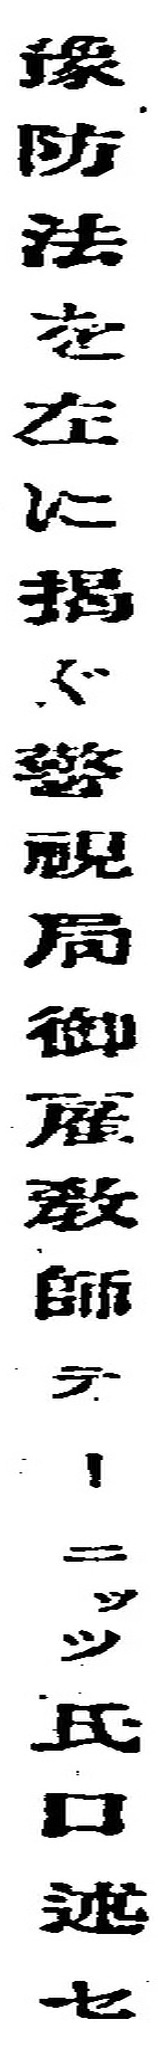予防法を左に掲ぐ警視局御雇教師テーニッツ氏口述せ
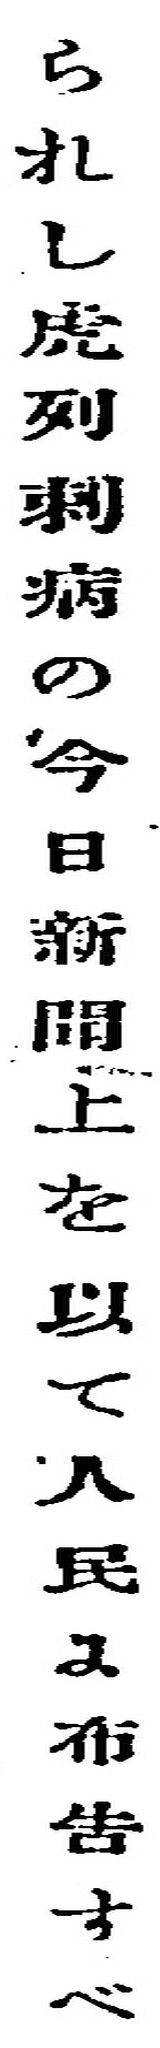られし虎列刺病の今日新聞上を以て人民に布告すべ
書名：これら病予防心得
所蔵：国立国会図書館 National Diet Library, JAPAN
